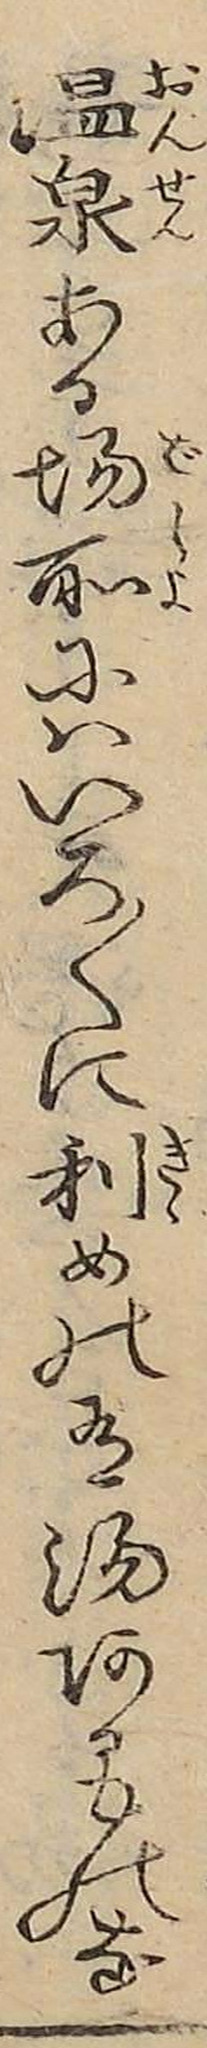温泉ある場所にはいろ〳〵に利めの有湯あるものな
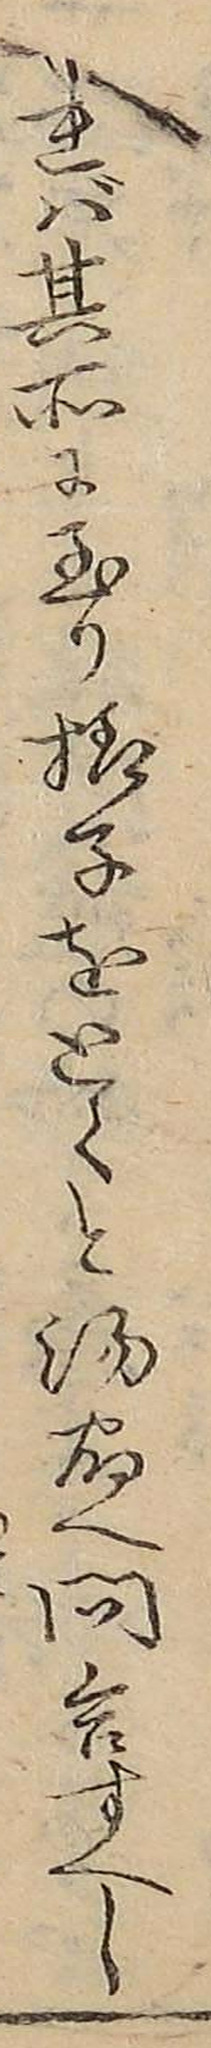れば其所に至り様子をとくと湯宿へ問合すへし
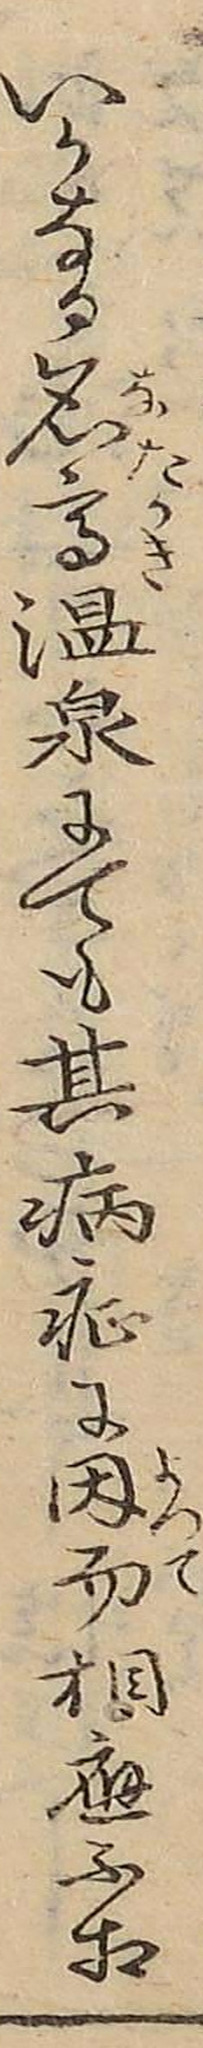いかなる名高温泉にても其病症に因而相応ふ相
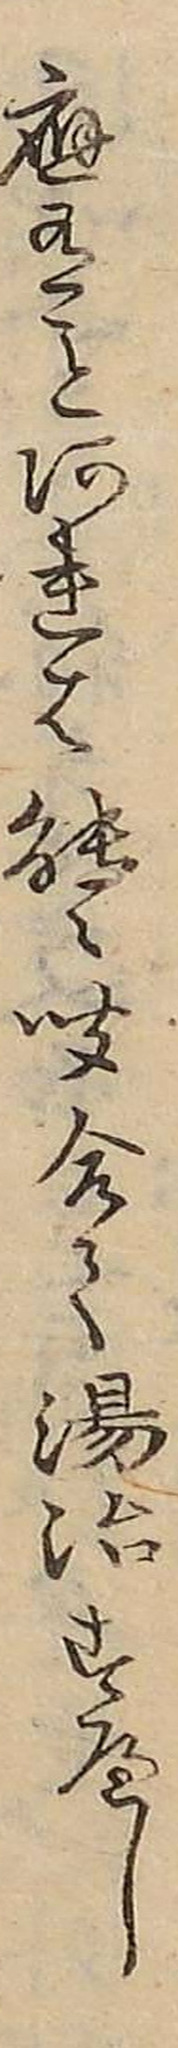応有ことあれは能々聞合て湯治すへし
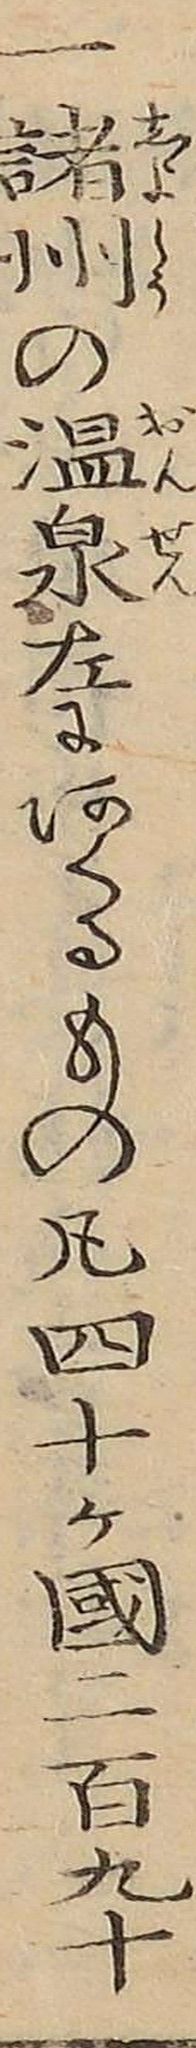一諸州の温泉左にあくるもの凡四十ケ国二百九十
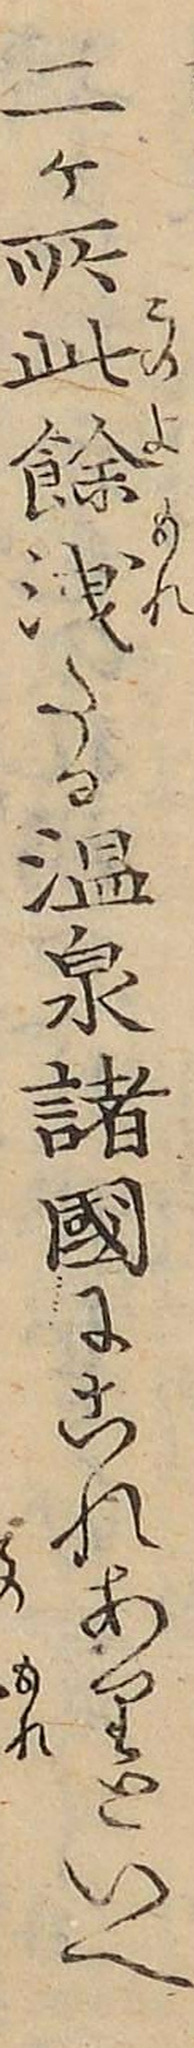二ケ所此余洩たる温泉諸国にこれありといへ
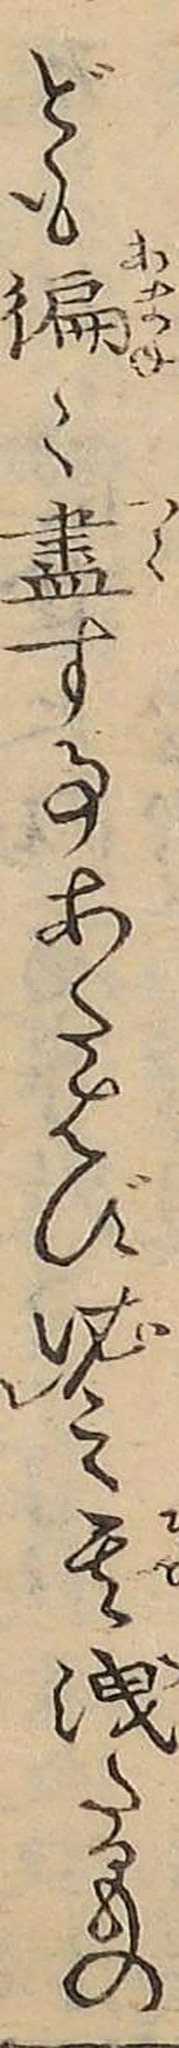ども徧く尽す事あたはず依之其洩たるもの
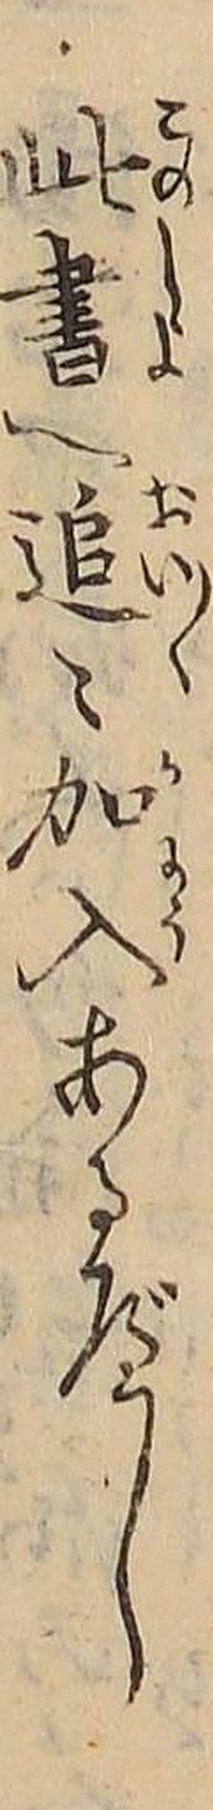此書へ追々加入あるべし
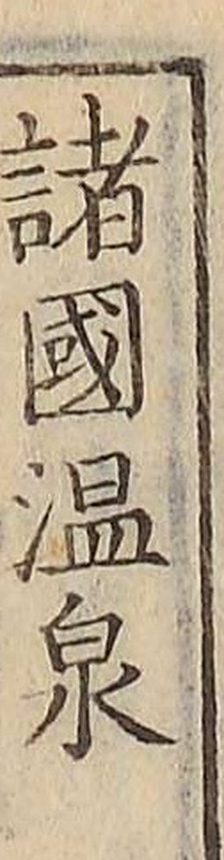諸国温泉
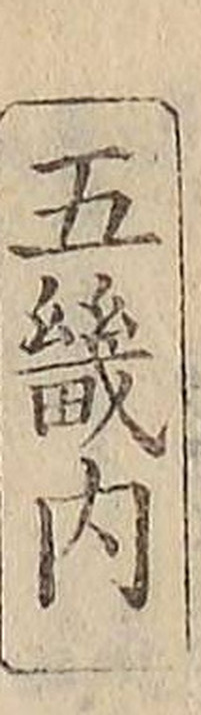五幾内
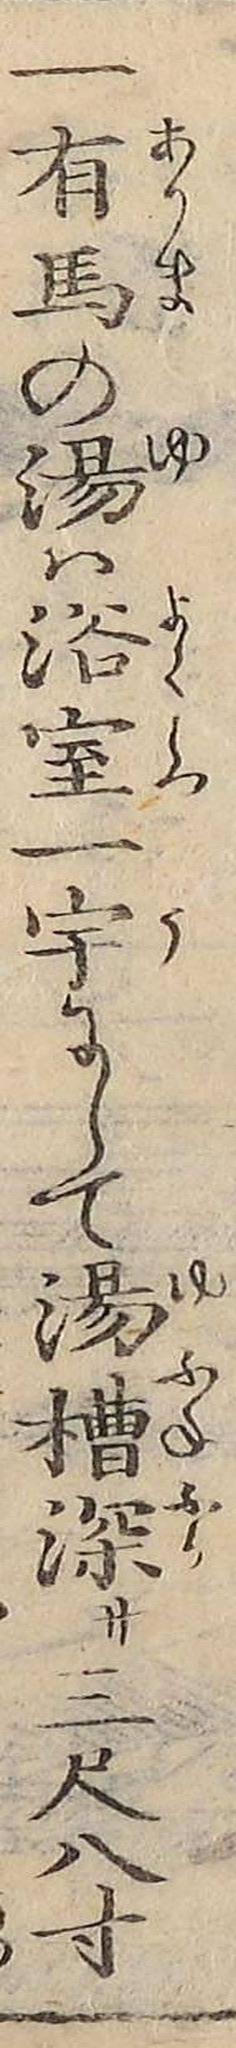一有馬の湯は浴室一宇にして湯槽深三尺八寸
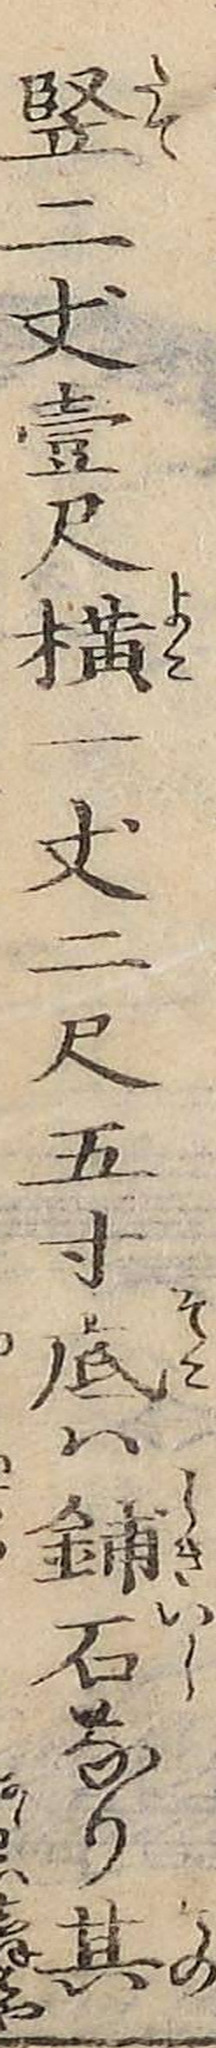堅二丈壱尺横一丈二尺五寸底は鋪石なり其
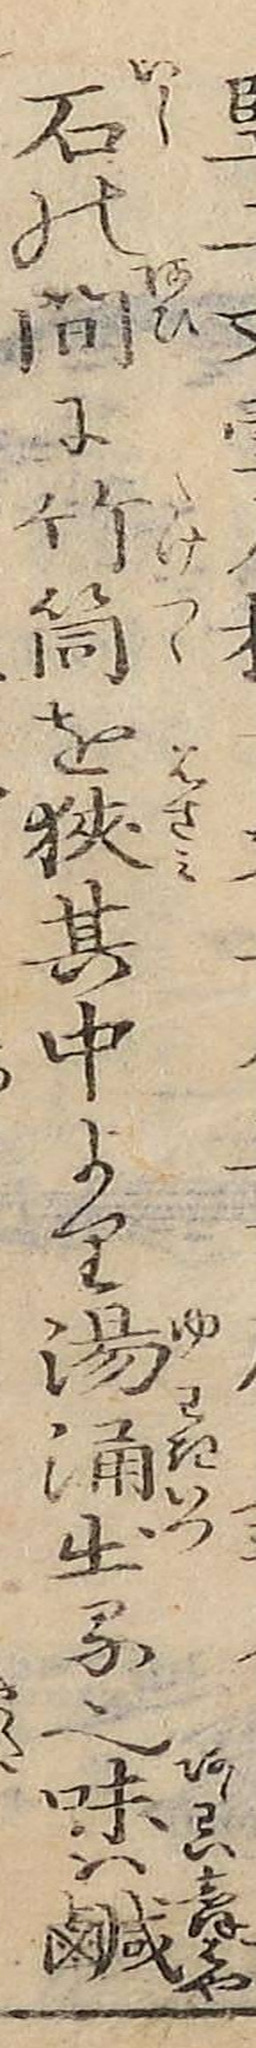石の間に竹筒を狭其中より湯涌出る也味は鹹
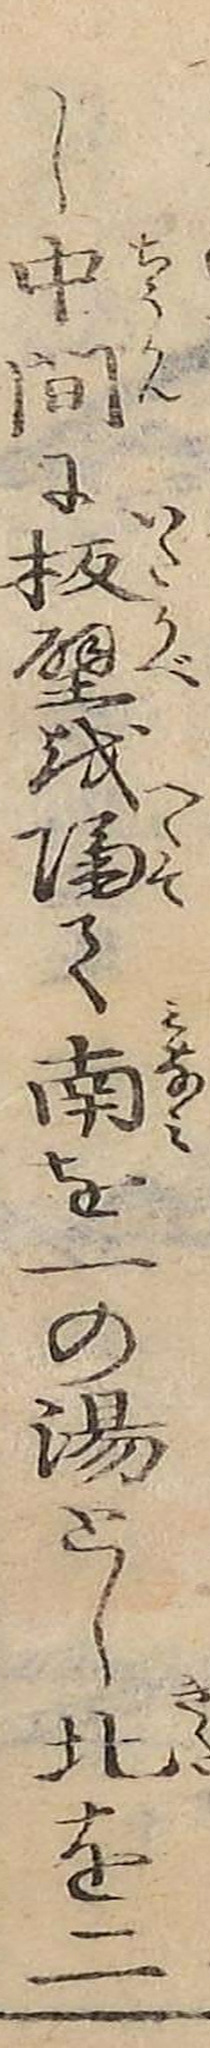し中間に板壁を隔て南を一の湯とし北を二

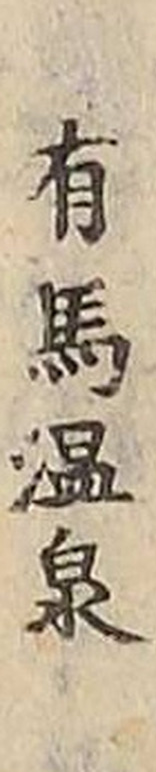有馬温泉
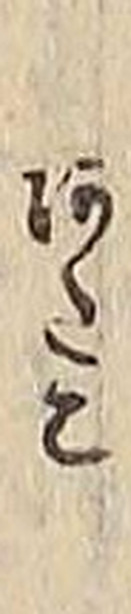あたこ
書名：旅行用心集
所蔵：神戸大学附属図書館 国文学研究資料館
